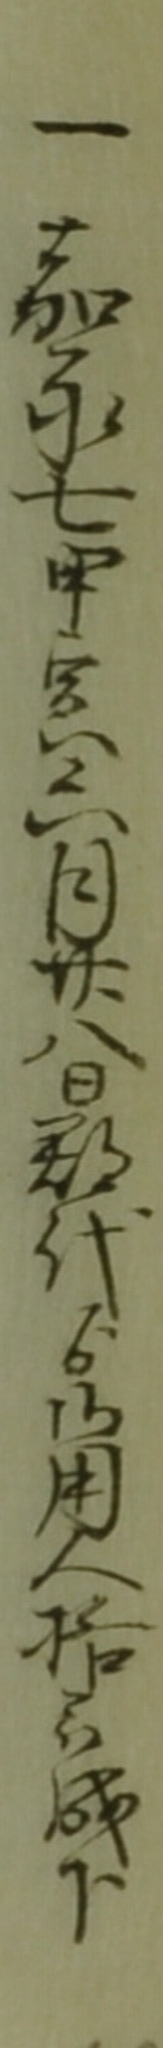一嘉永七甲寅六月廿八日郡代ゟ御用人格被成下
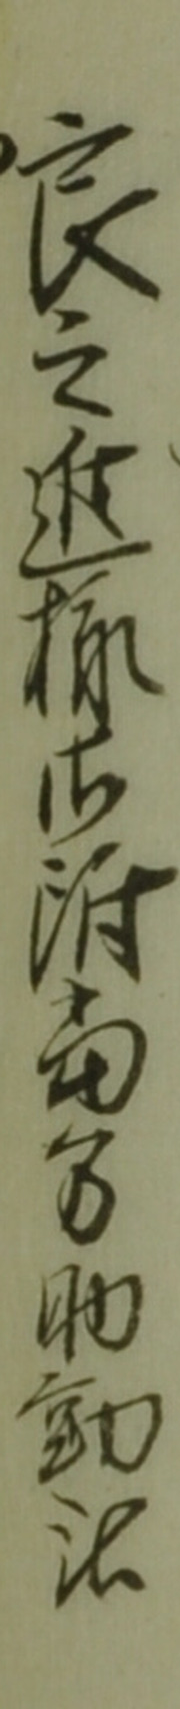良之進様御附当方助勤被
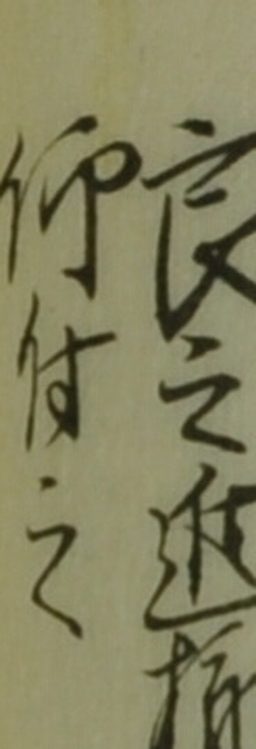仰付之
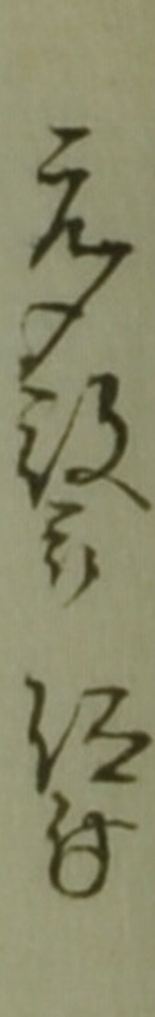元〆役被仰付
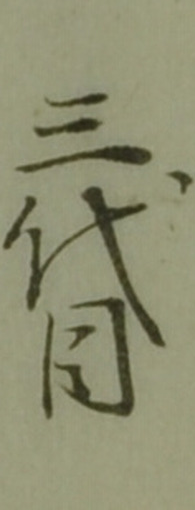三代目
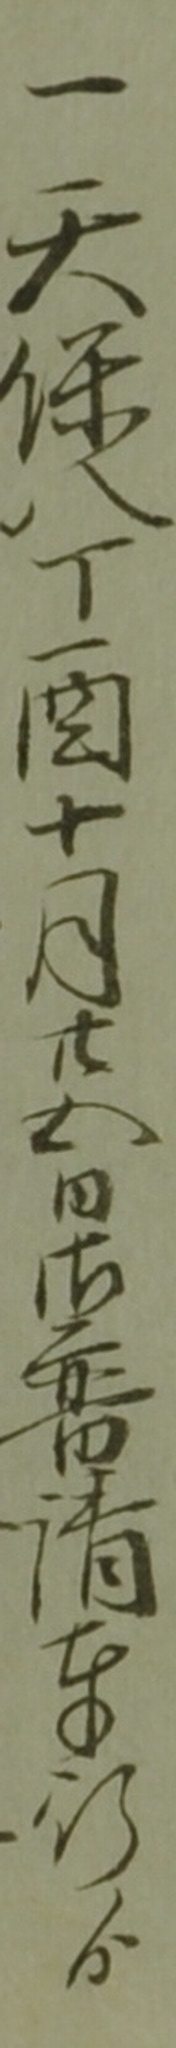一天保八丁酉十月廿五日御普請奉行ゟ
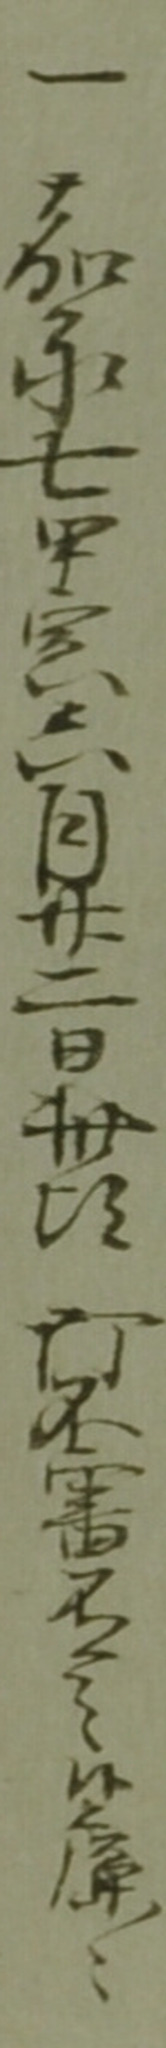一嘉永七甲寅六月廿二日此頃御不審有之候廉々
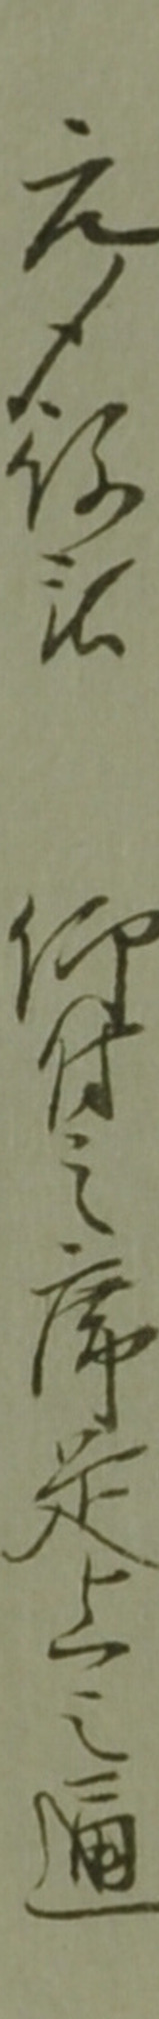元〆役被仰付之席是迄之通
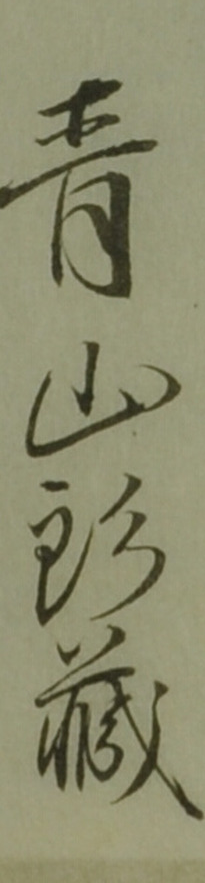青山釤蔵
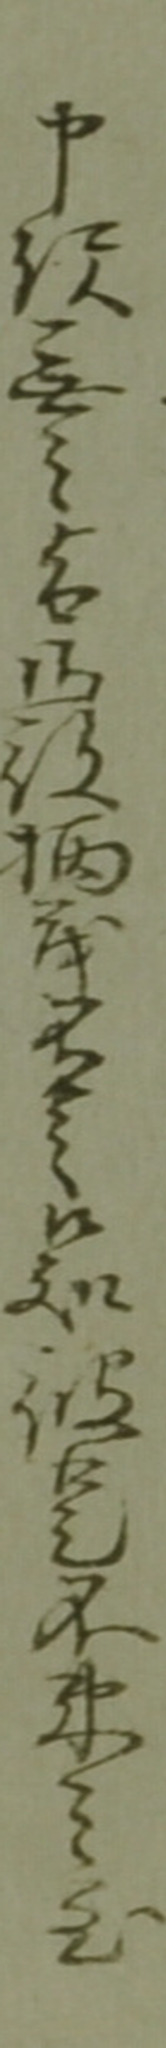申訳無之旨御役柄茂有之候処彼是不束之至
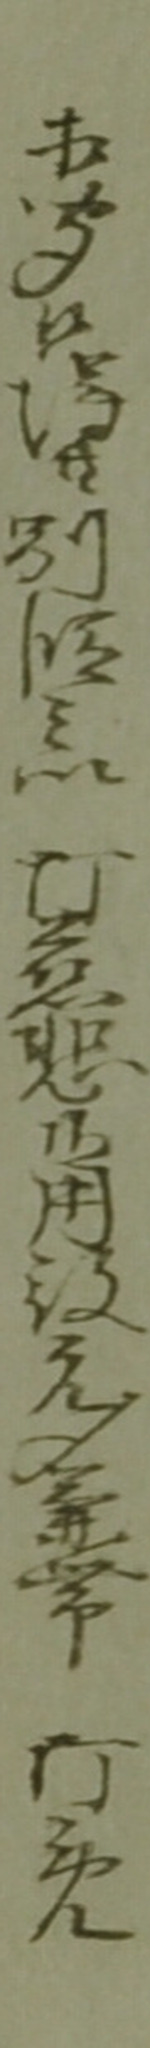相聞候得共別段之以御慈悲御用役元〆兼帯御免
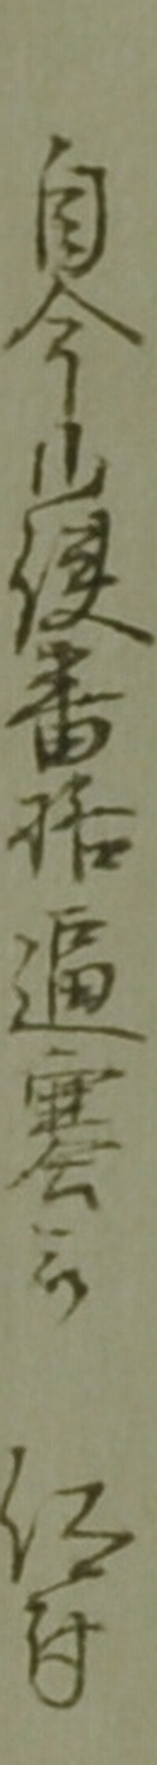自今御使番格逼塞被仰付
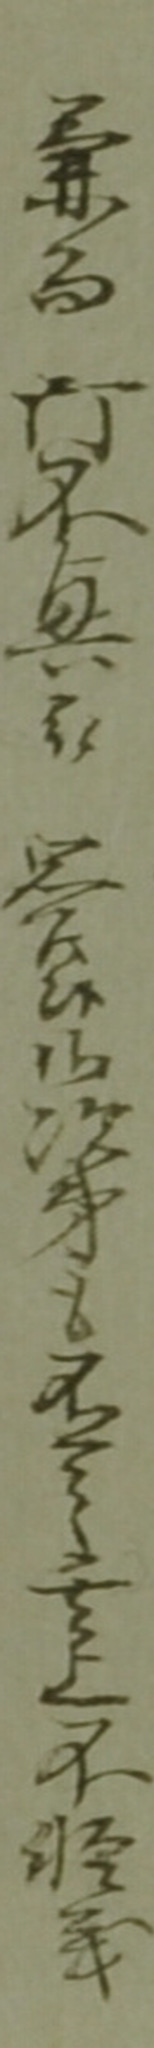兼而御不興被思召候御次第も有付其上不軽義
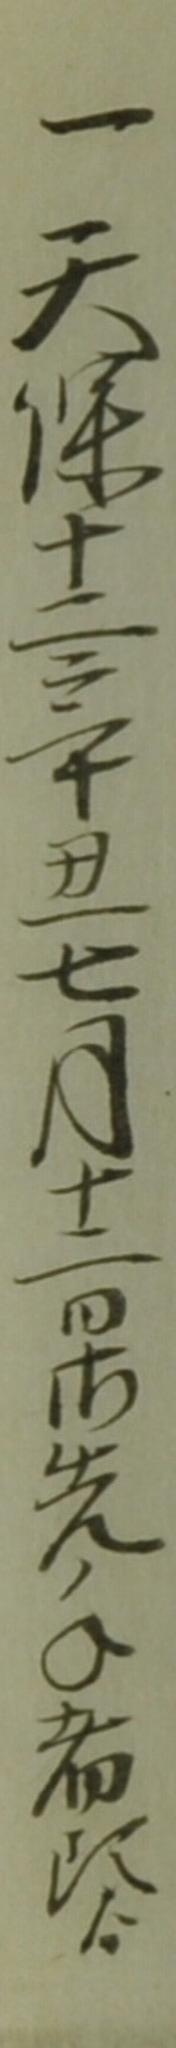一天保十二辛丑七月十二日御先手者頭ゟ
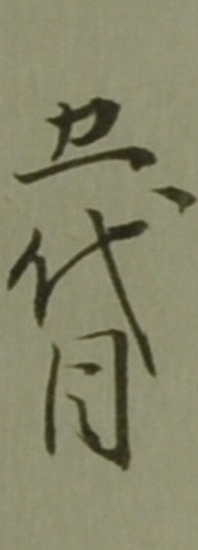五代目
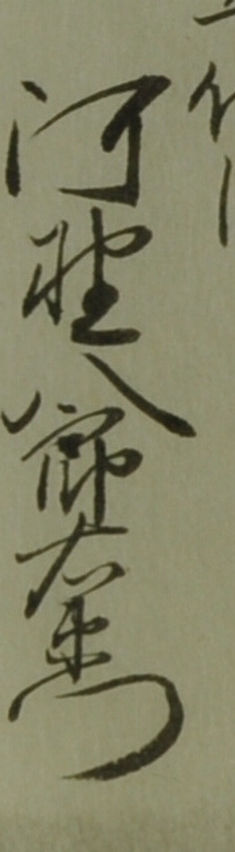河野八郎右衛門
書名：諸御役代々録（七）
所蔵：伊那市立高遠町図書館・合同会社AMANE
